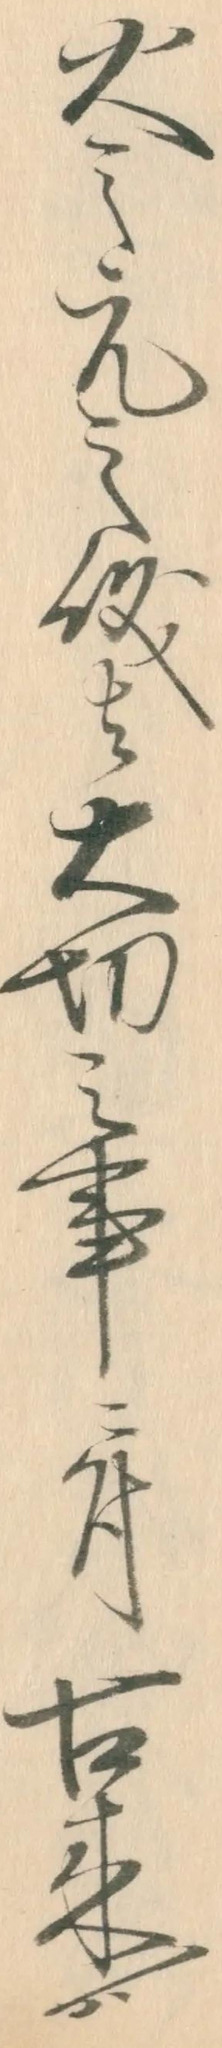火之元之儀は大切之事ニ付古来ゟ
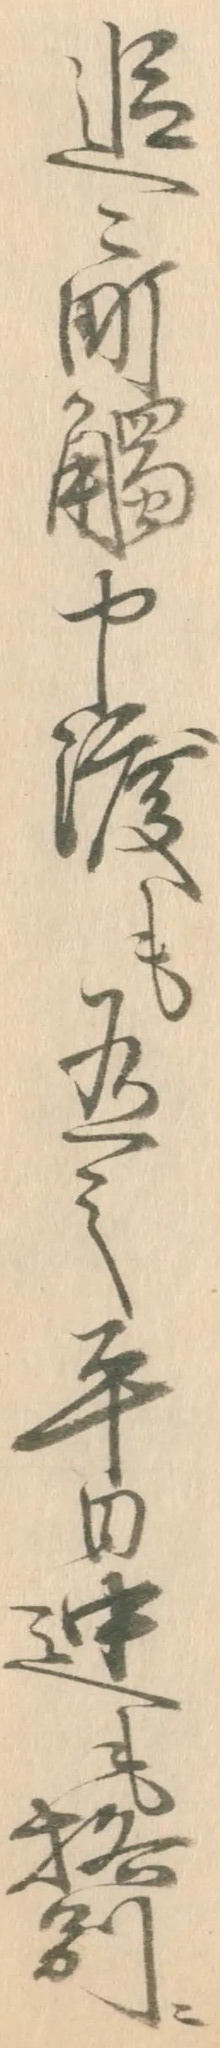追々町触申渡も有之平日迚も格別ニ

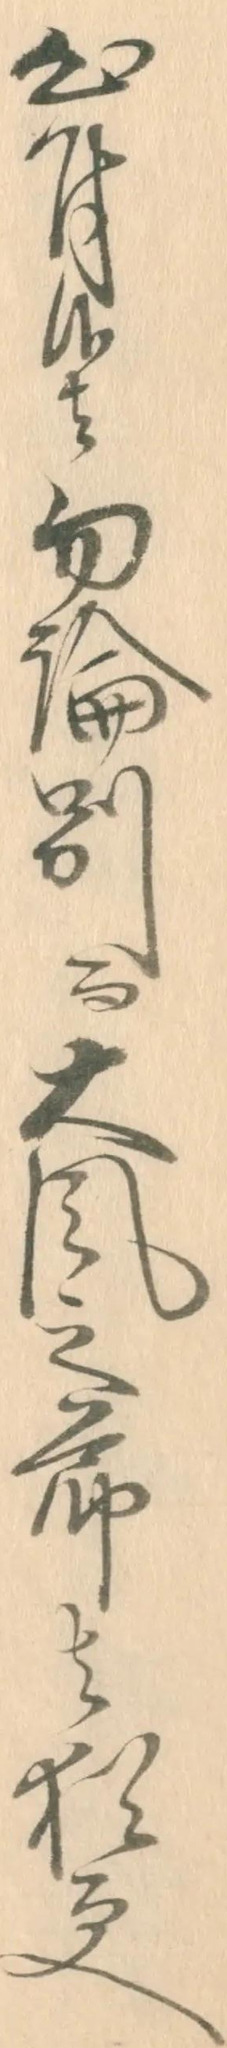心付候は勿論別而大風之節は猶更
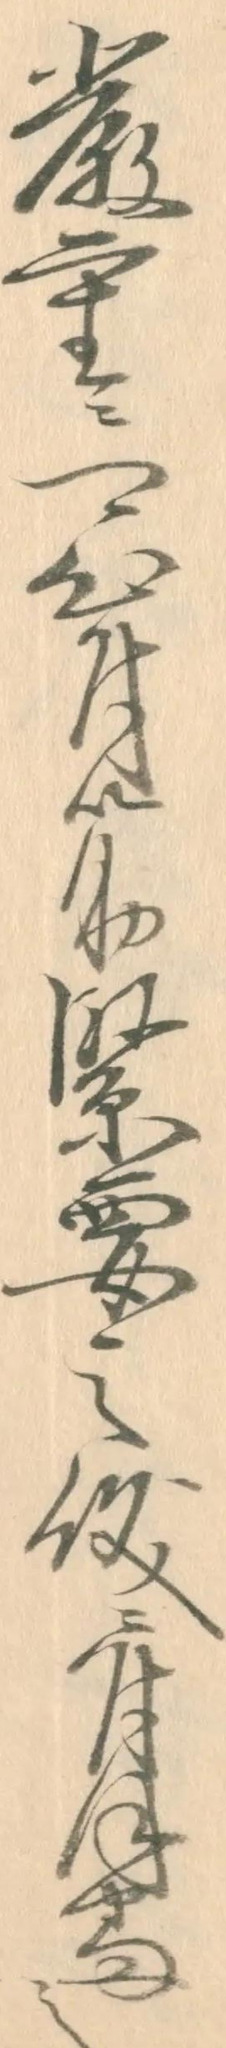厳重ニ可心付筋緊要之儀ニ付月番之
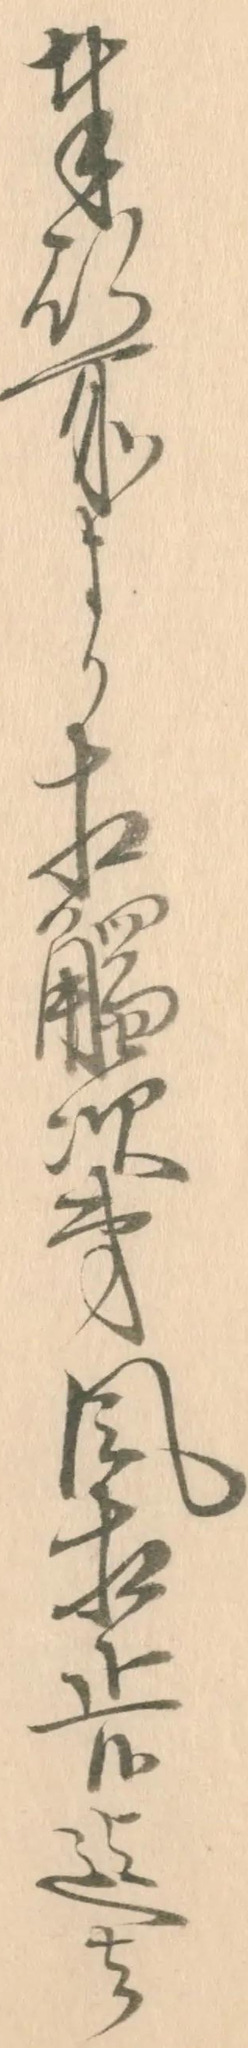奉行所より相触次第風相止候迄は
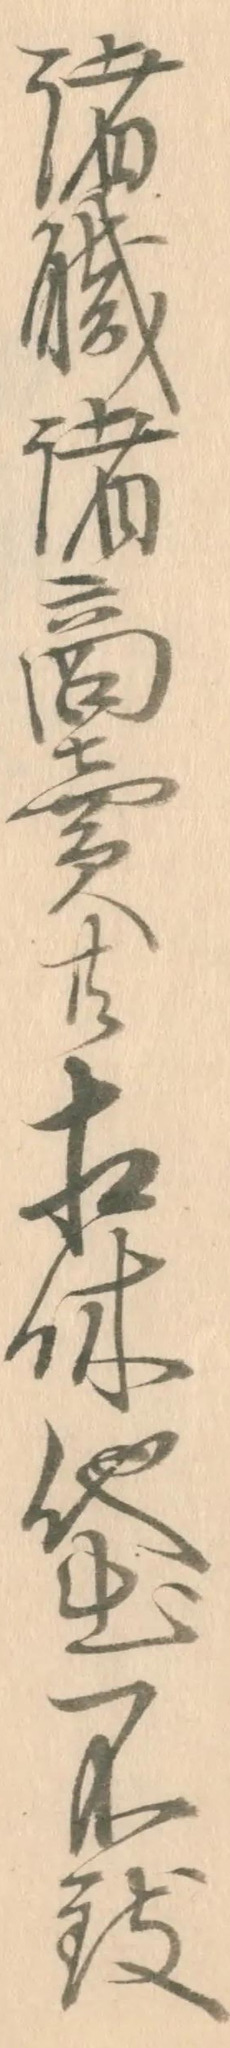諸職諸商売共相休他出不致
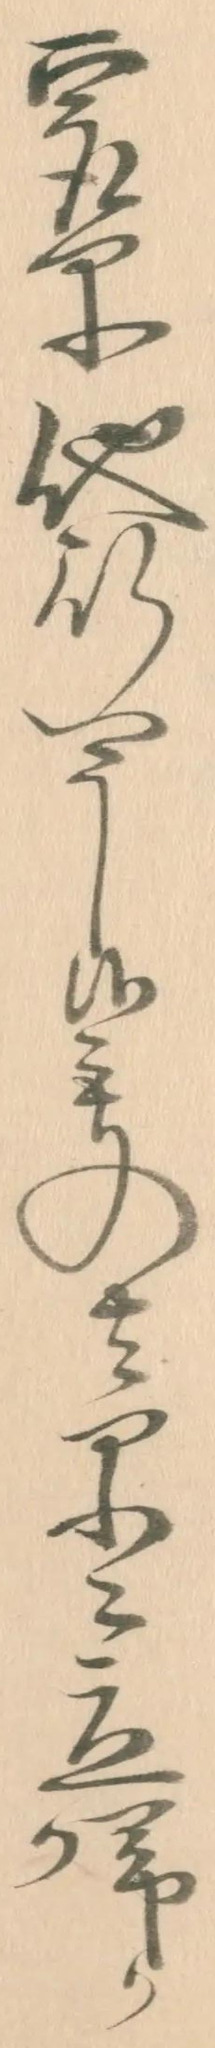最早他行いたし候ものは早々立帰り
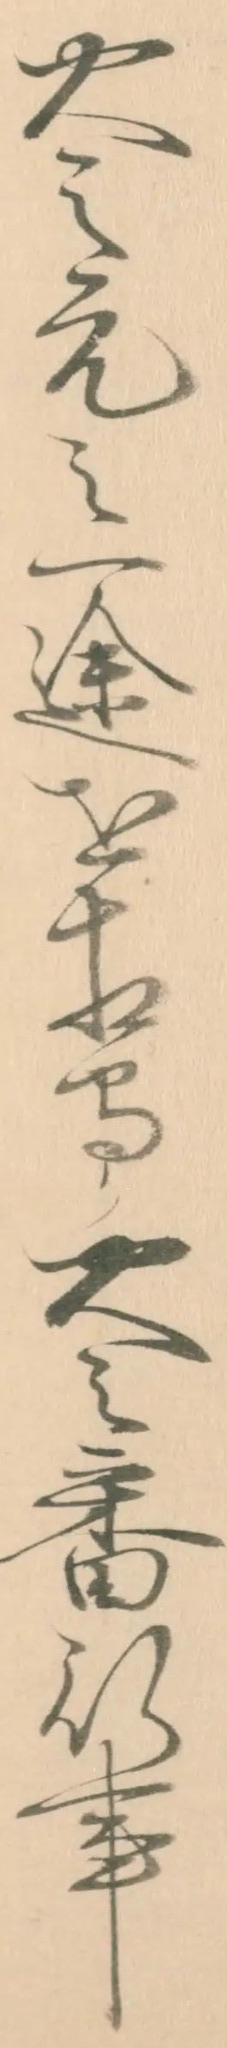火之元之一途を相守火之番行事
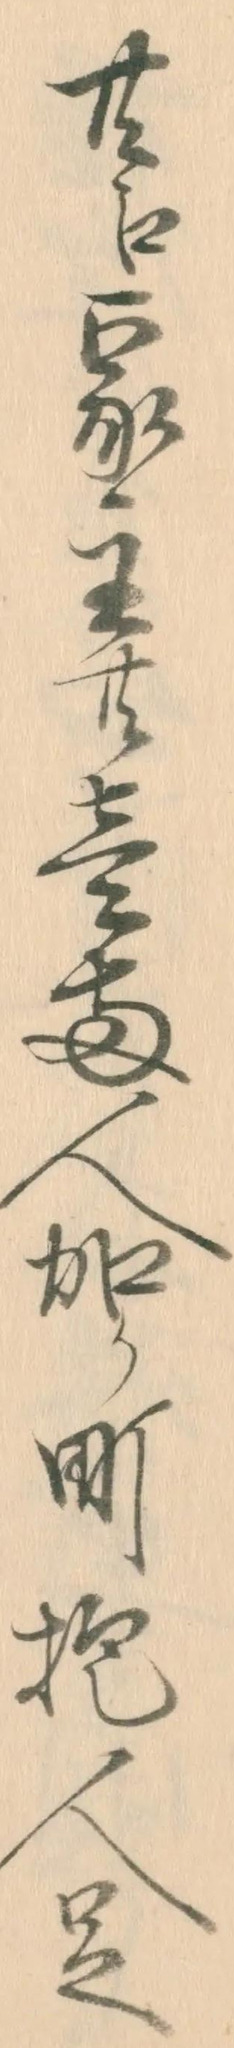共え家主共壱両人加り町抱人足
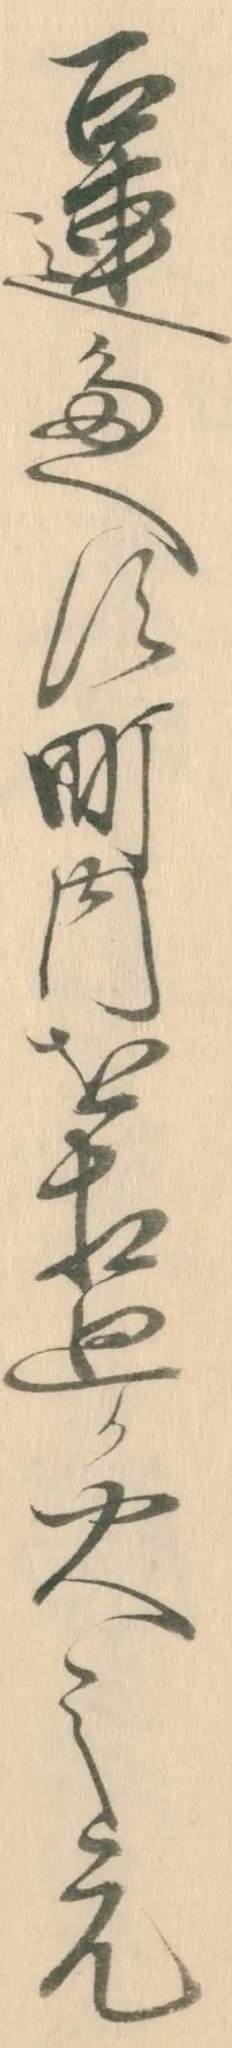召連たへす町内を相廻り火之元
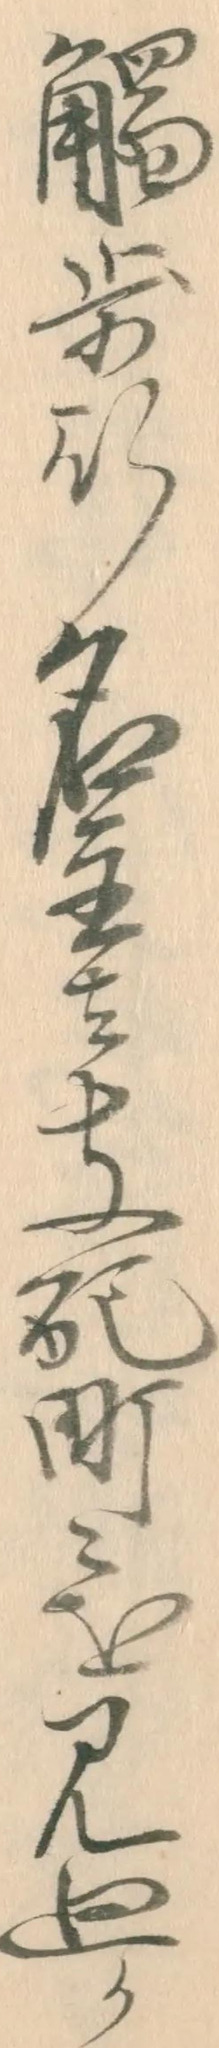触歩行名主は支配町々を見廻り
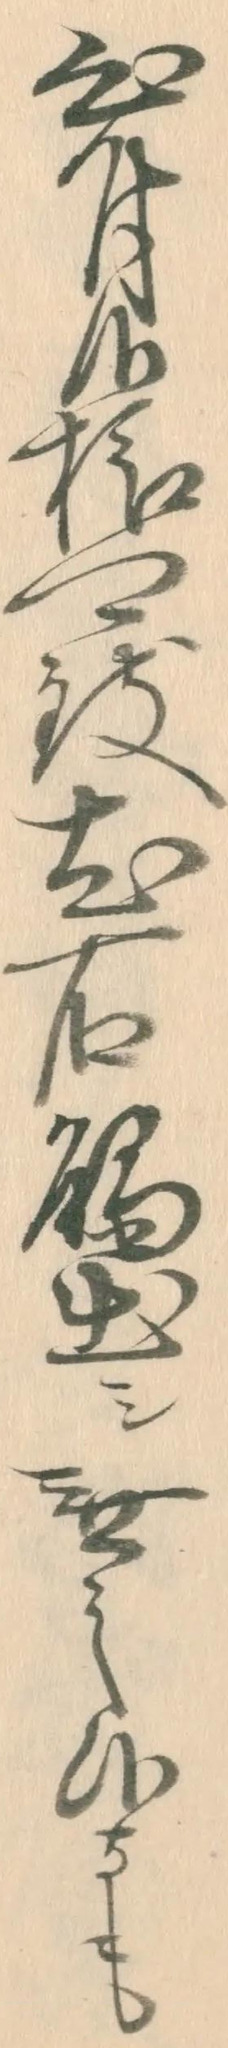心付候様可致尤右触出シ無之候とも
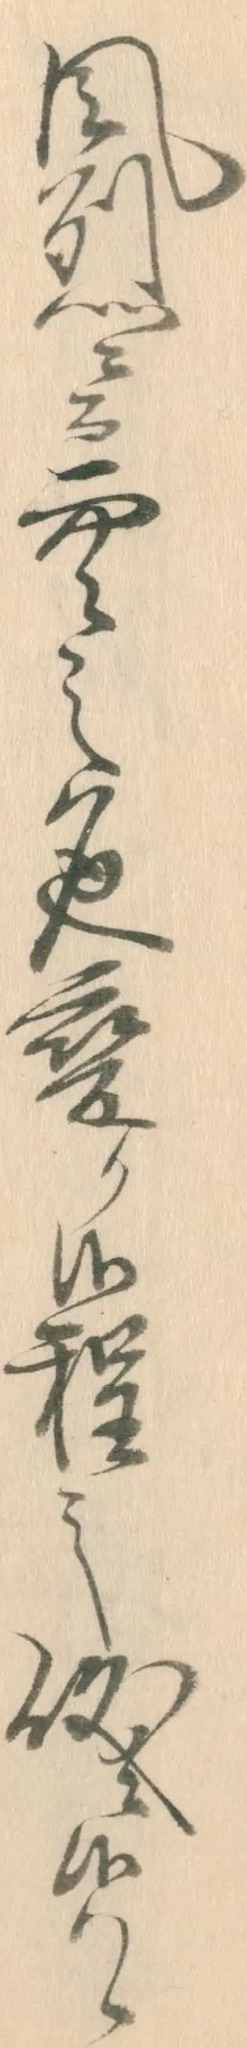風烈ニ而空之色変り候程之儀ニ候ハヽ
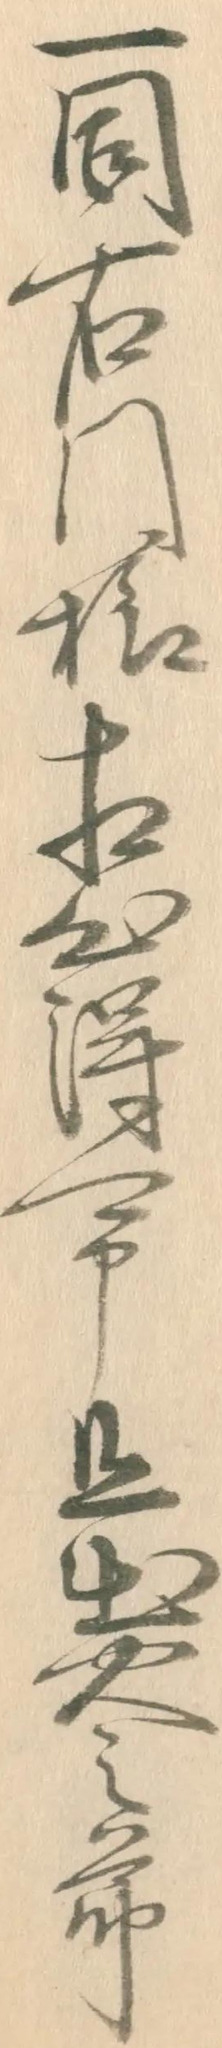一同右同様相心得可且出火之節

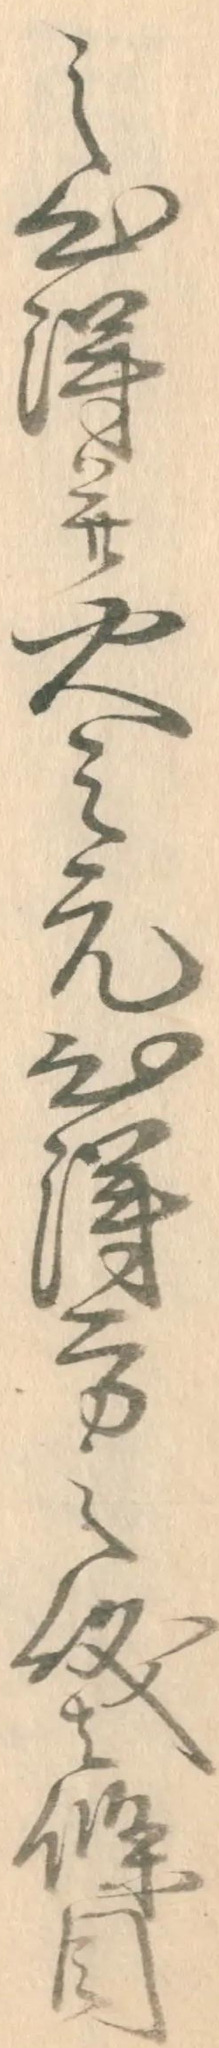之心得并火之元心得方之儀は条目
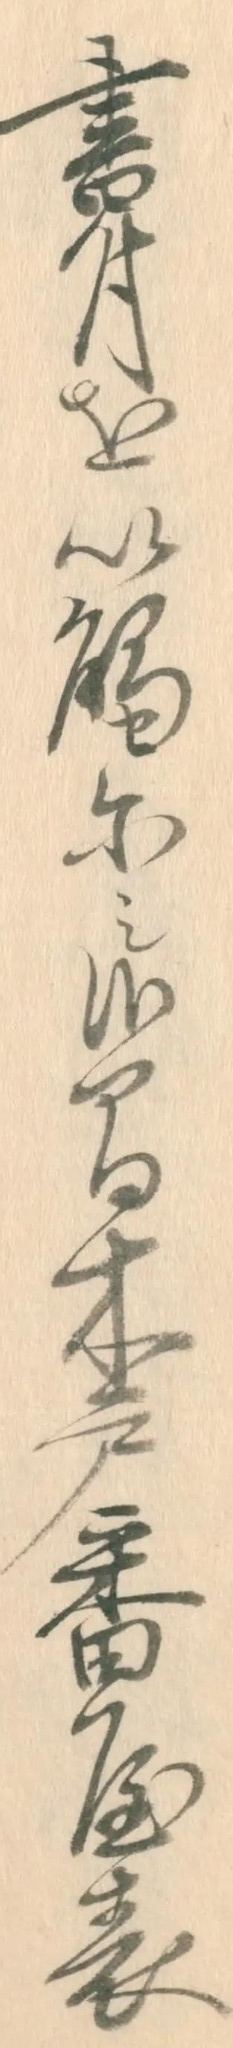書付を以触示シ候間木戸番屋表
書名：三橋 17巻. [7] 三橋小破御修復書留　但御奉行御掛リ替地震潰橋番屋　嘉永四亥年より安政二卯年迄　上
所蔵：国立国会図書館 National Diet Library, JAPAN
